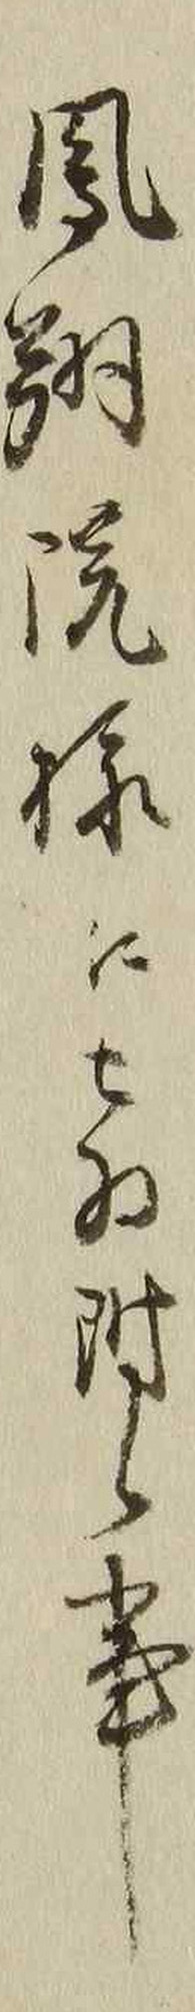鳳翔院様江被為附候事
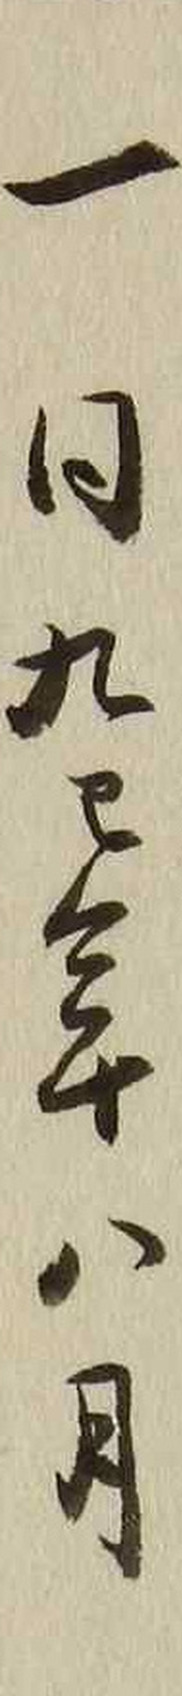一同九巳年八月
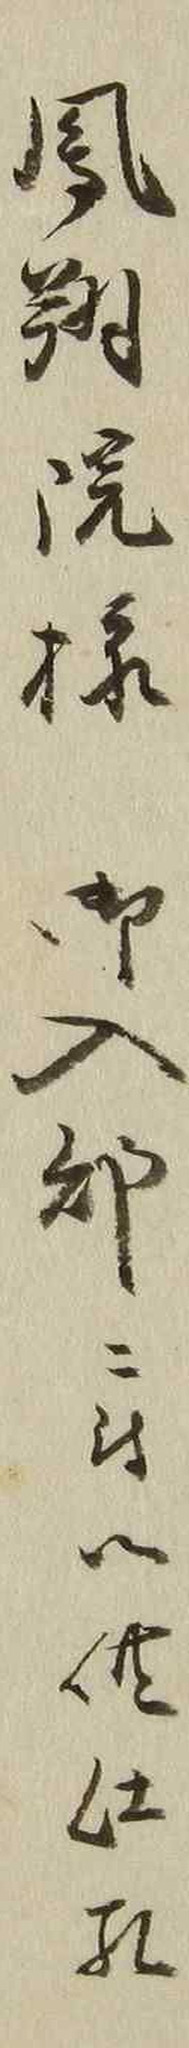鳳翔院様御入部ニ付御供仕罷
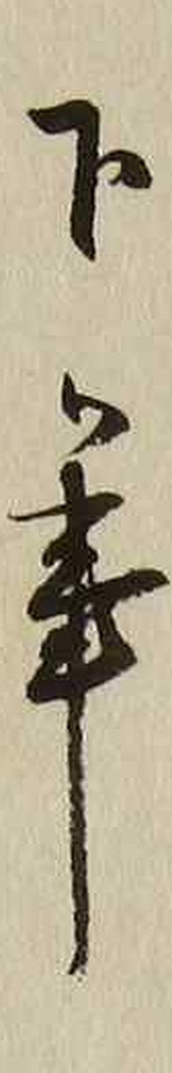下候事
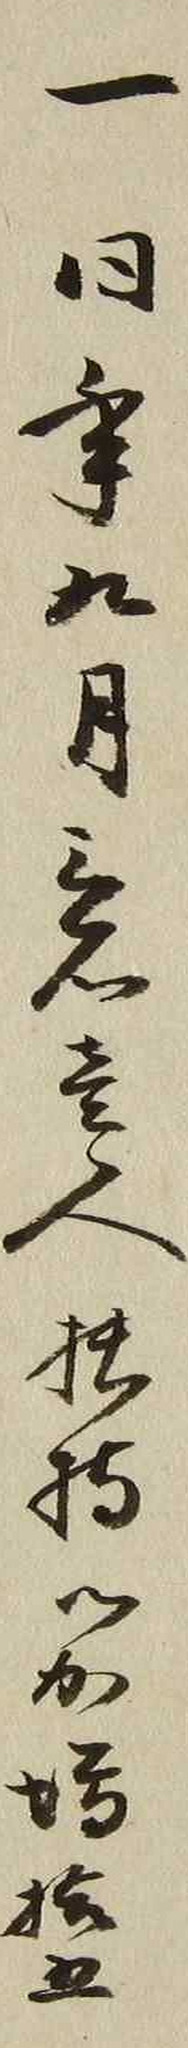一同年九月三石壱人扶持御加増拾五
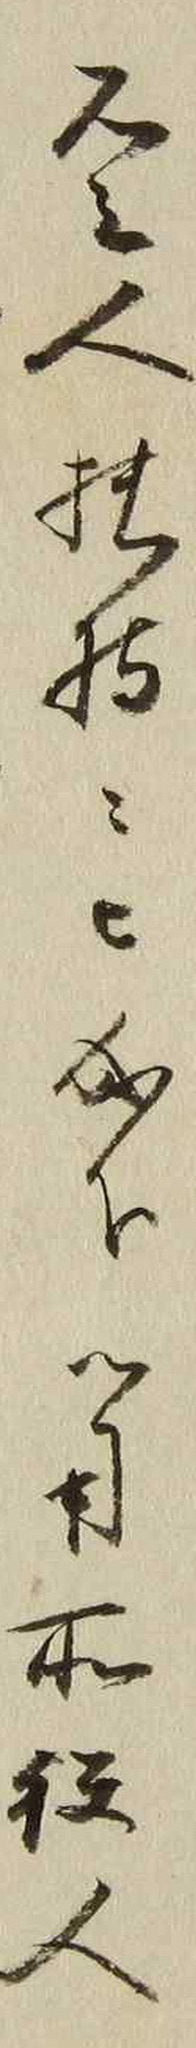石三人扶持ニ被成下御用所役人
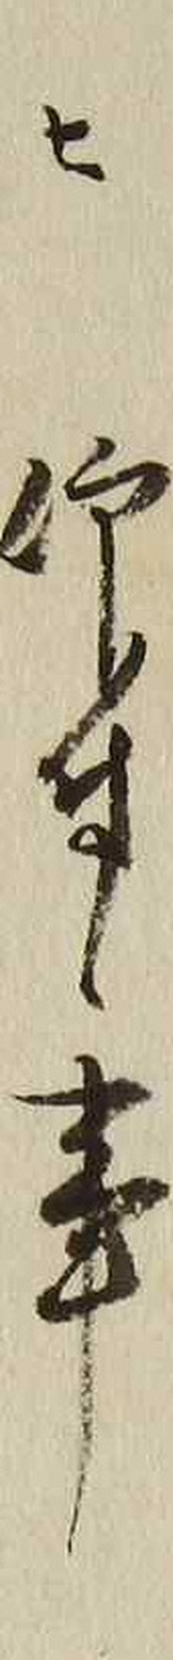被仰付候事
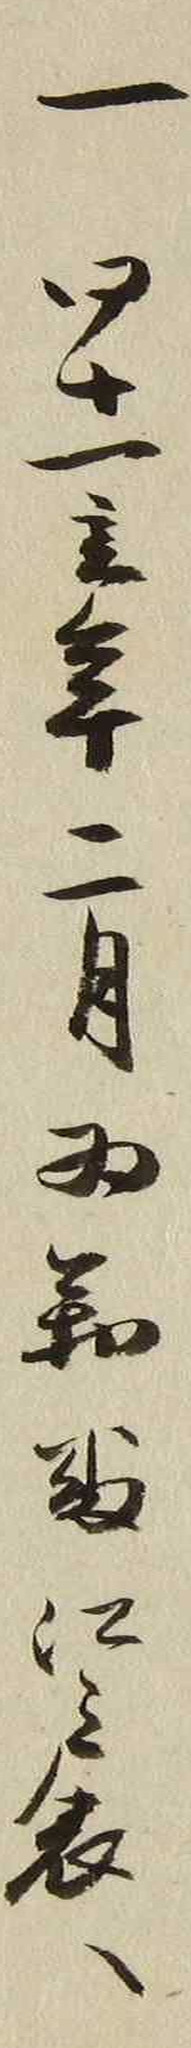一同十一亥年二月為勤番江戸表へ
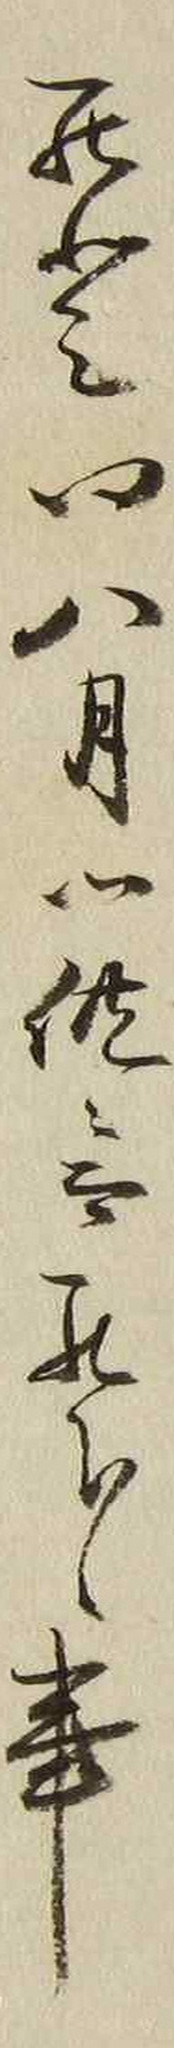罷登同八月御供ニ而罷下候事
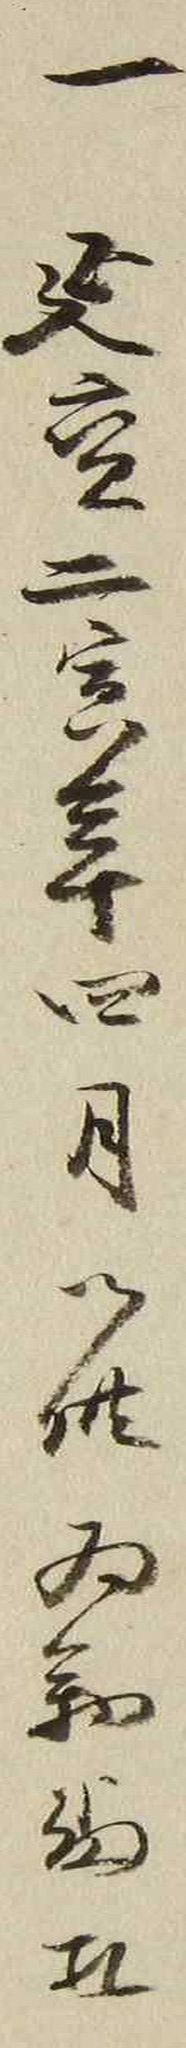一延宝二寅年四月御供為勤番罷
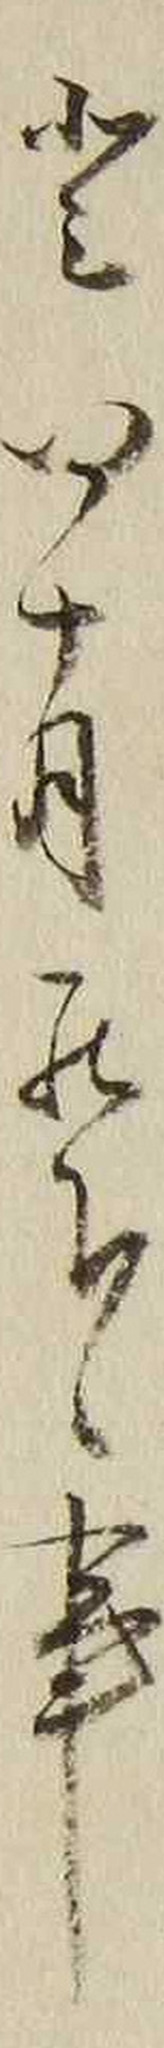登同十月罷下候事
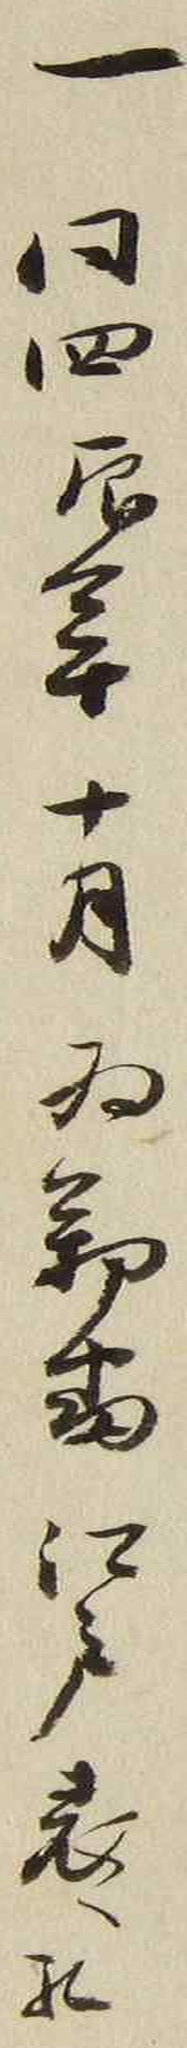一同四辰年十月為勤番江戸表へ罷
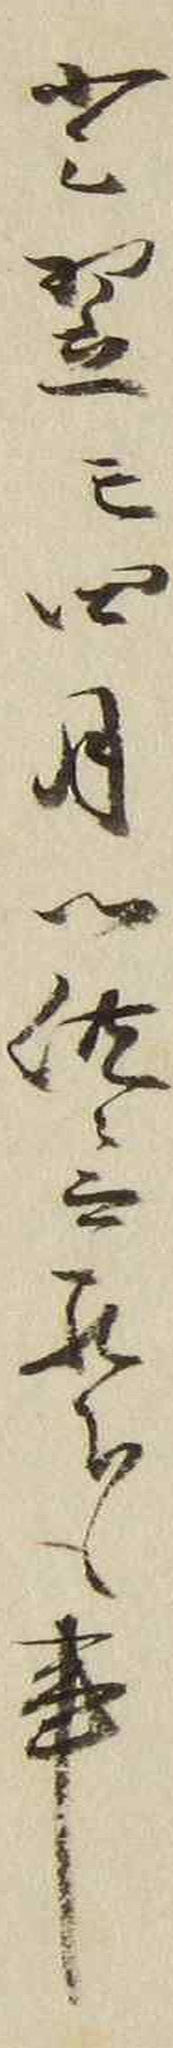登翌巳四月御供ニ而罷下候事

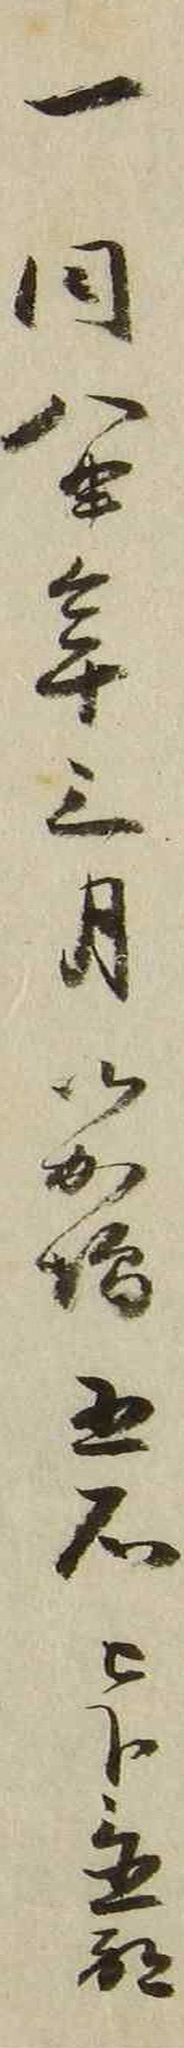一同八申年三月御加増五石被下置都
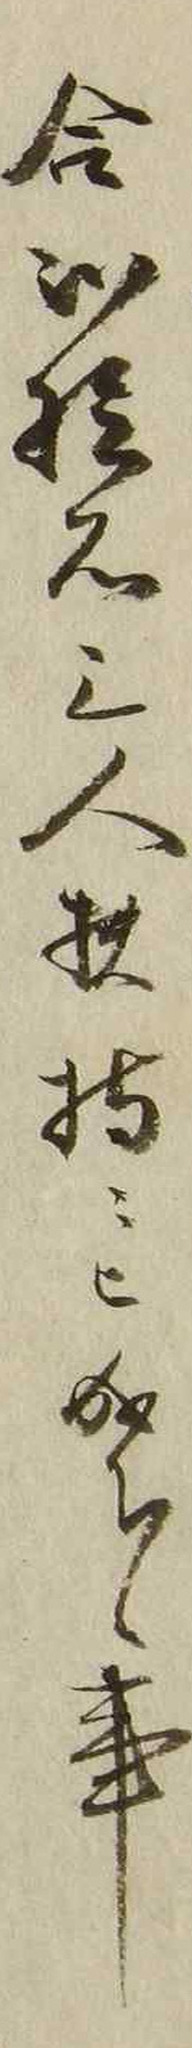合弐拾石三人扶持ニ被成下候事
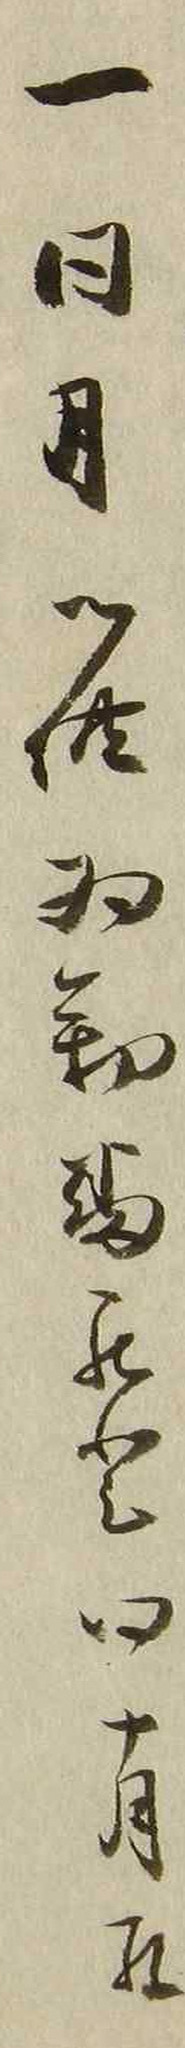一同月御供為勤番罷登同十月罷
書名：諸士系譜　巻之288　さ之部20
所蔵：会津若松市立会津図書館
